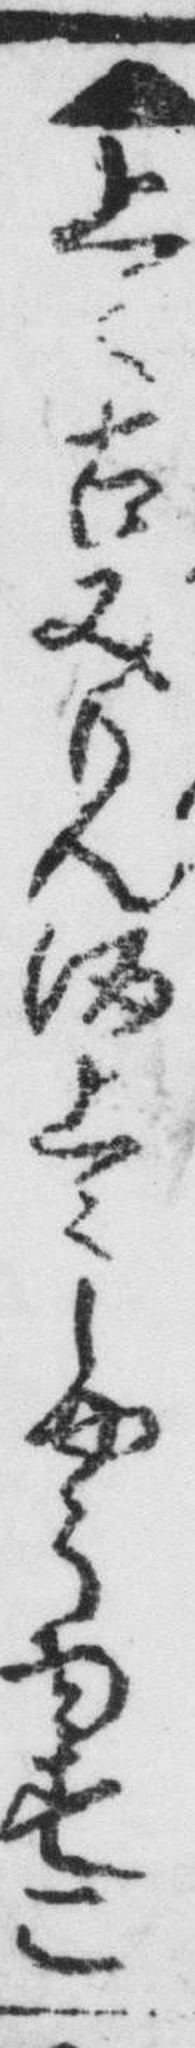▲上々古みりん酒上々しやうゆすこ
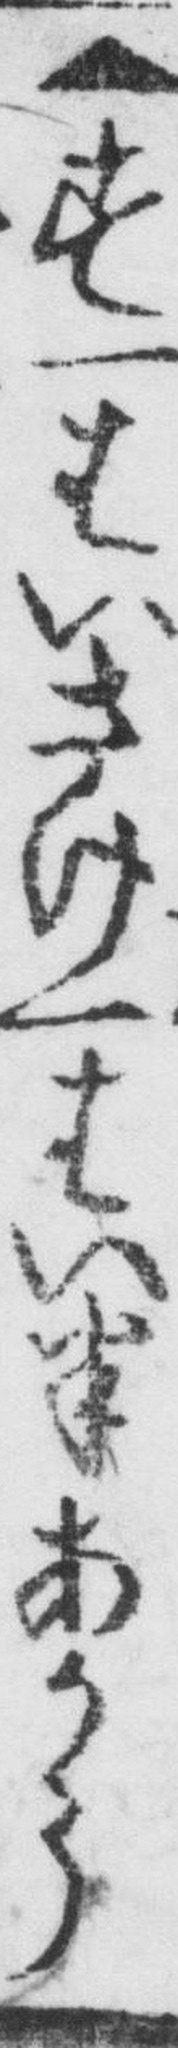▲す一はいさけ一はいれあかう
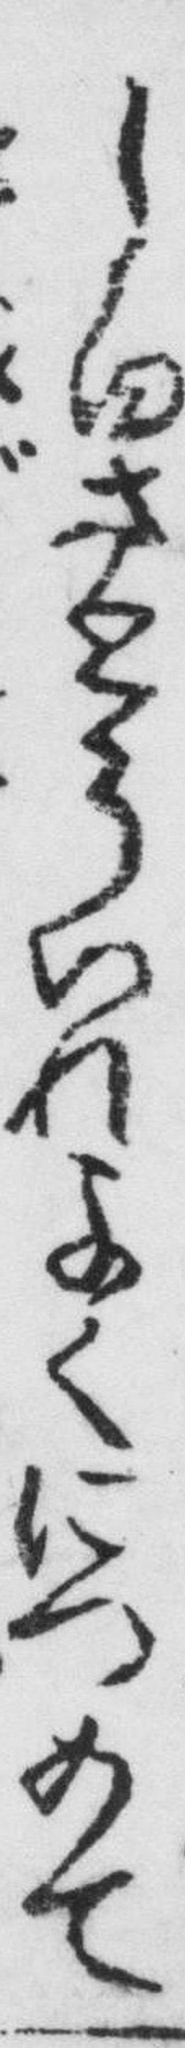し白さとういれよくにつめて
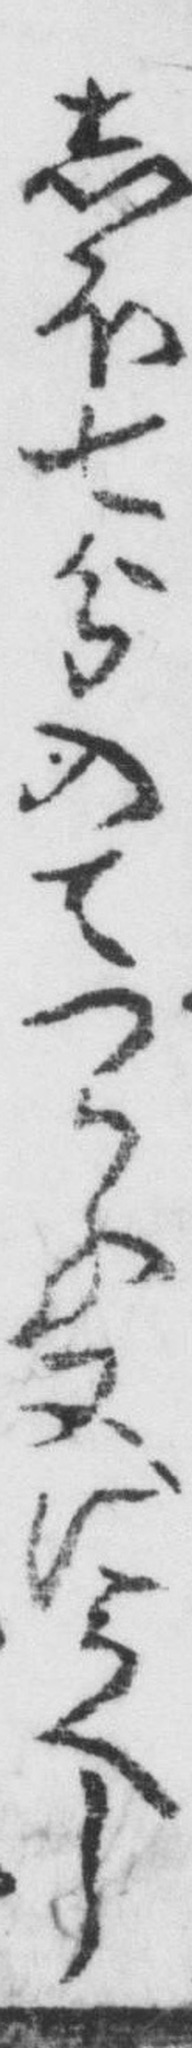しほ七分入てつかふ又にかへし
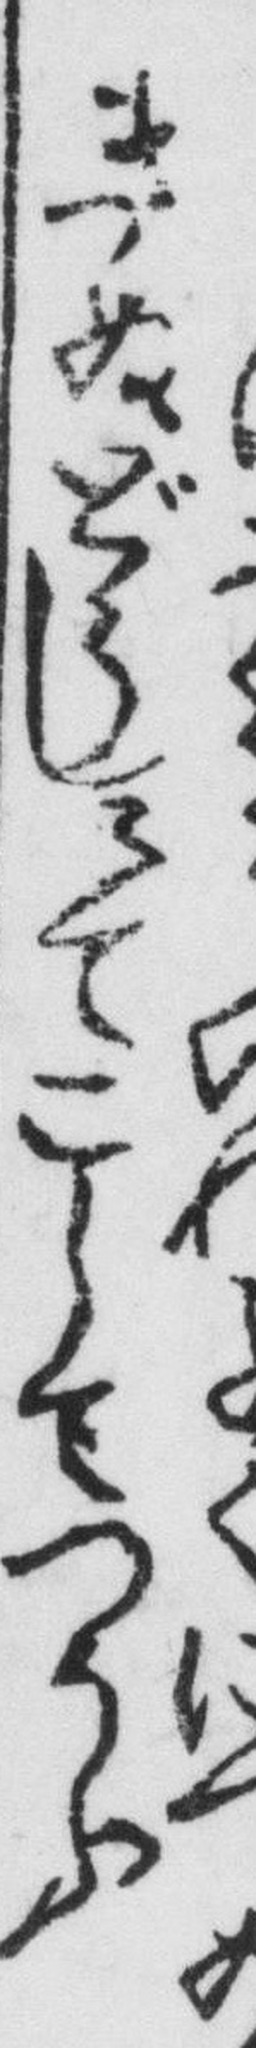まづぬどうしニてこしてつかふ
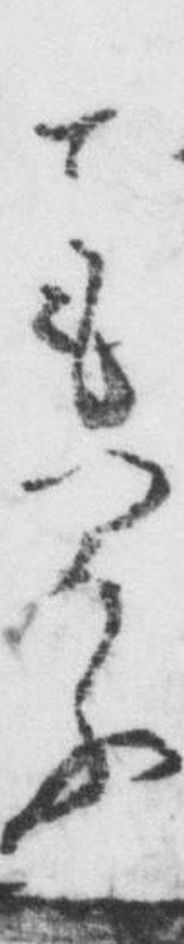てもつかふ

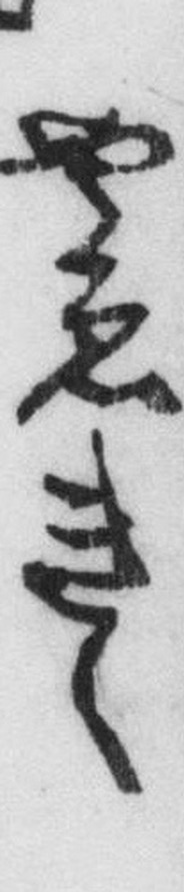やゑきく
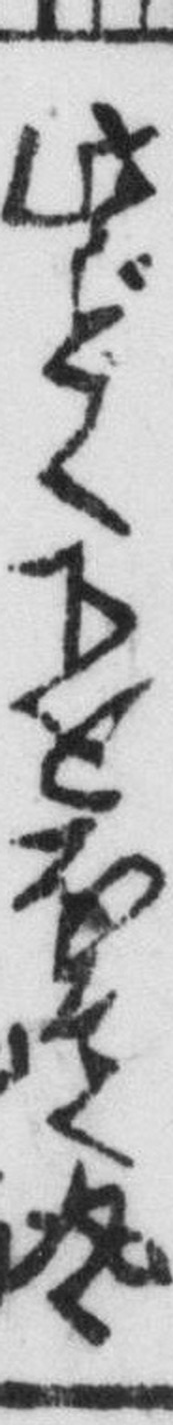丸丸ごとく下をほそく丸く
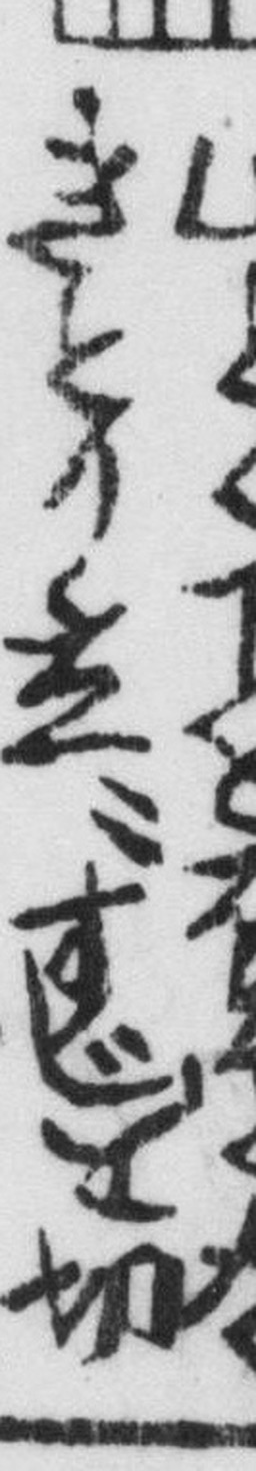きとり立々すぢを切
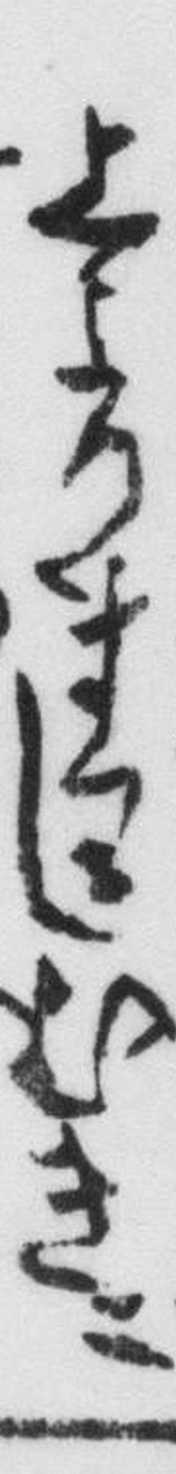上よりまハしむき二
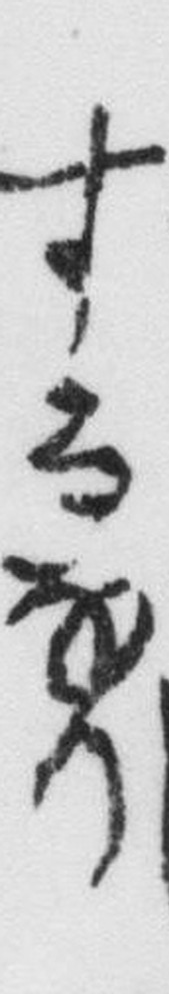するなり
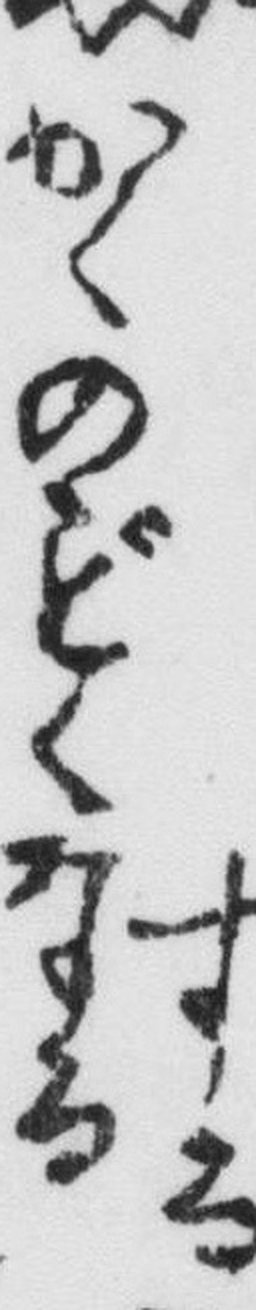かくのごとくなる
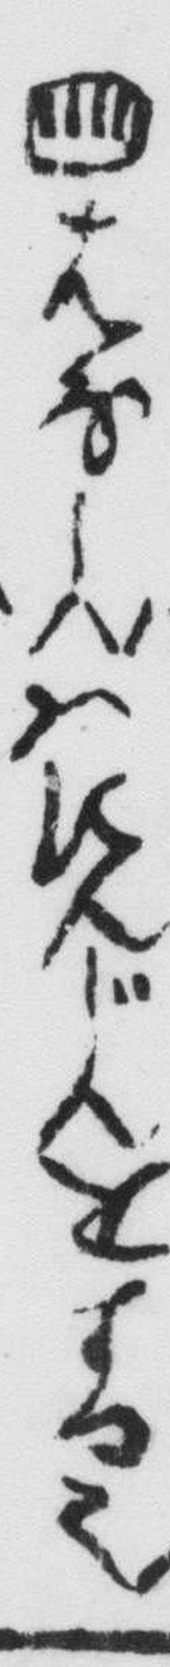はなしハにんじんをする也
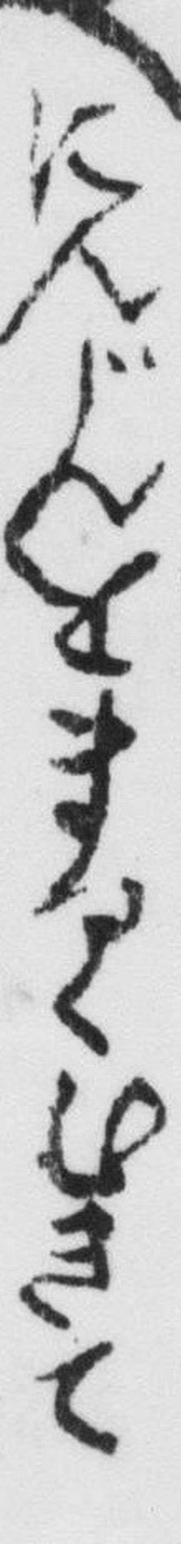にんじんをまるくむきて
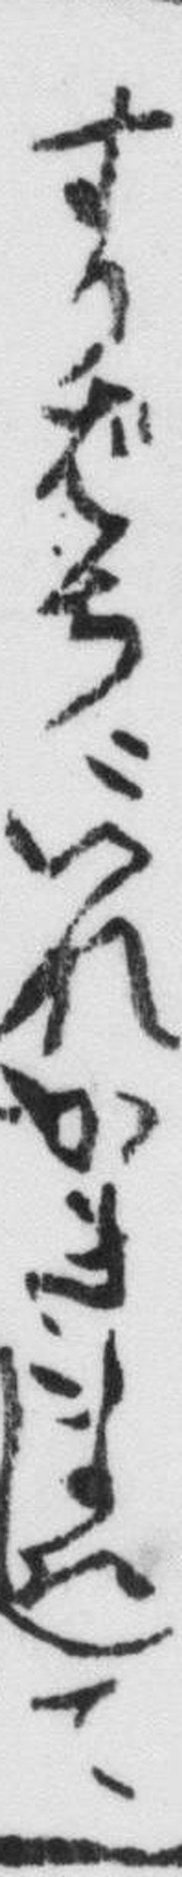すりばちニいれかきまハして
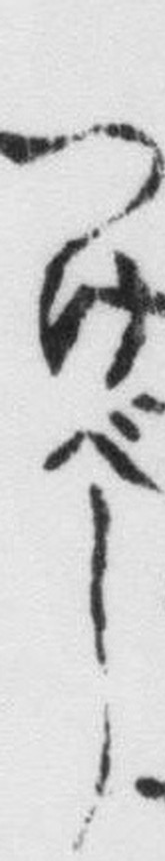つけべし
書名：即席料理/早指南
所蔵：大阪府立大学学術情報センター 国文学研究資料館
